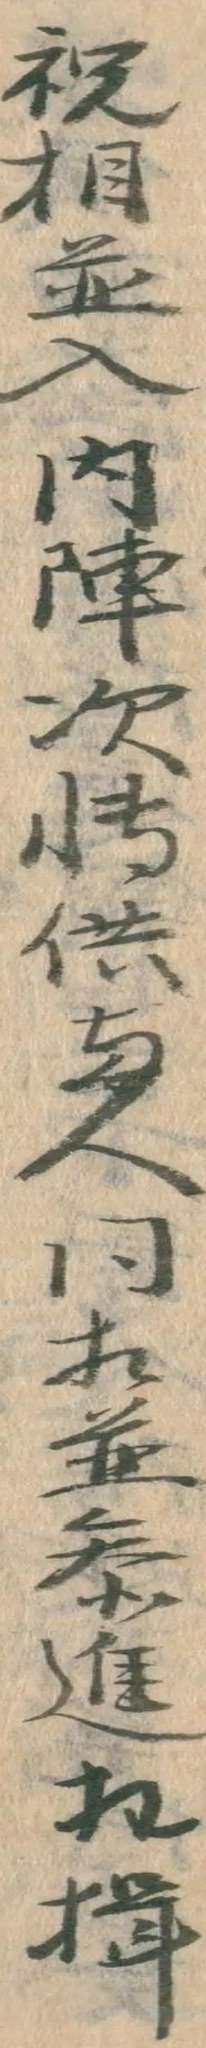祝相並入内陣、次轉供両人同相並参進、拝揖
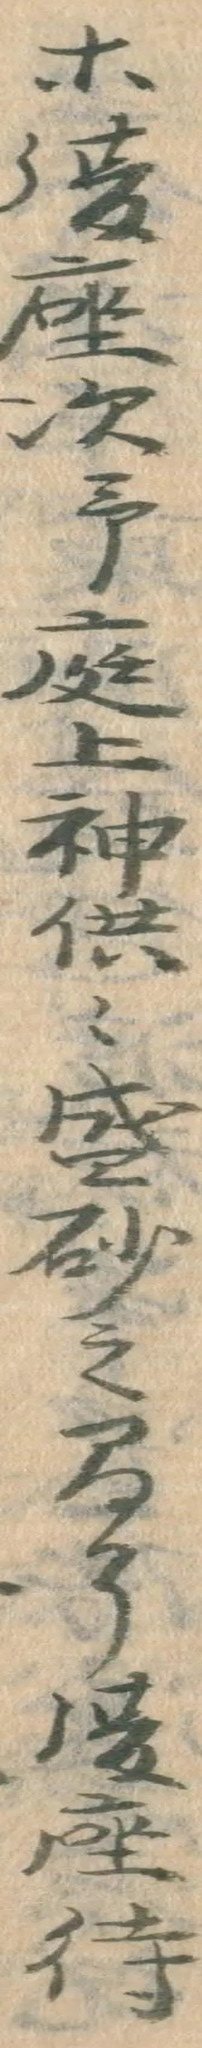等復座、次予庭上神供〻盛砂之間、了復座、待
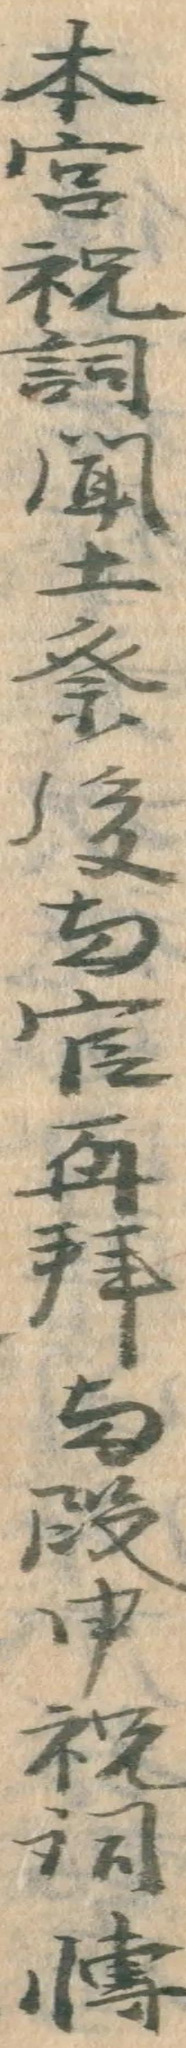本宮祝詞聞土祭後、両官再拝両段、申祝詞、傳
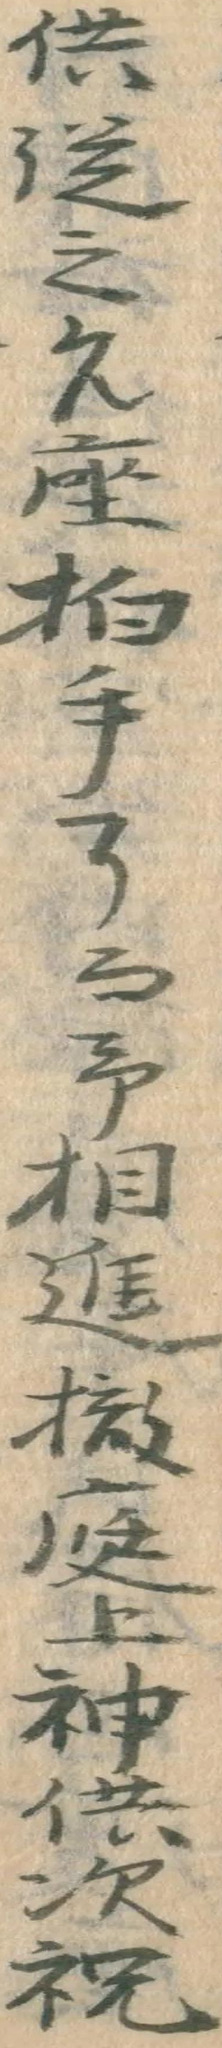供従之、乍座拍手、了而予撤庭上神供、次祝

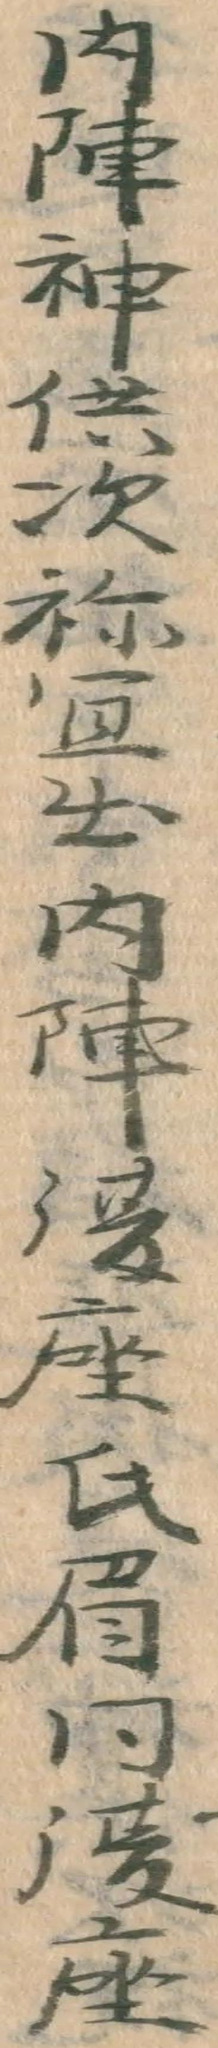内陣神供、次祢宜出内陣復座、氏眉同復座、
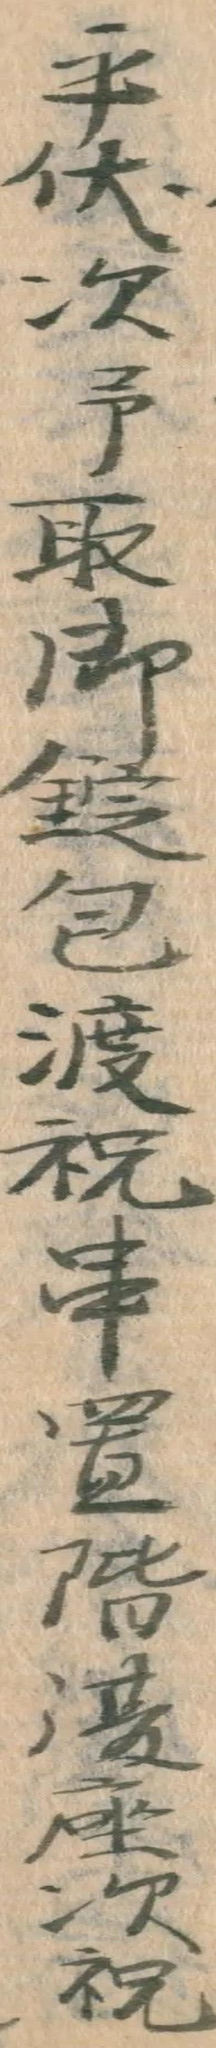平伏、次予取御錠包渡祝、串置階復座、次祝
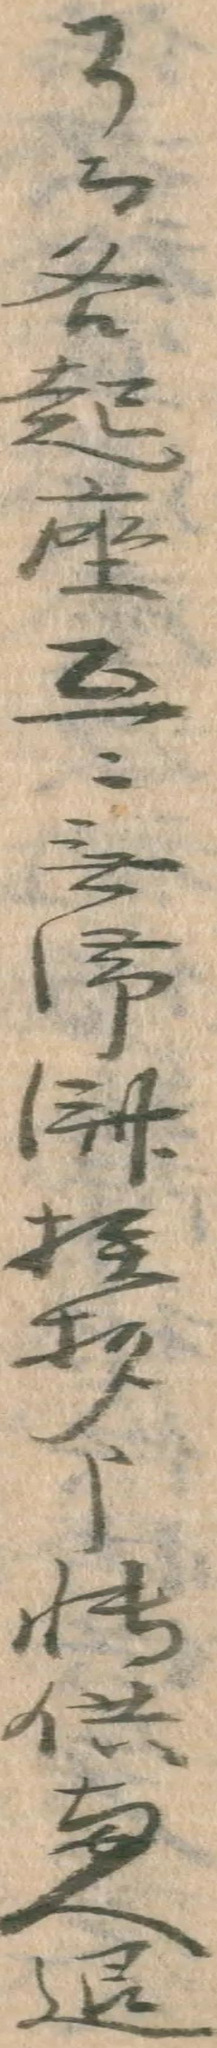了而各起座、互ニ無滞済挨拶申、轉供両人退
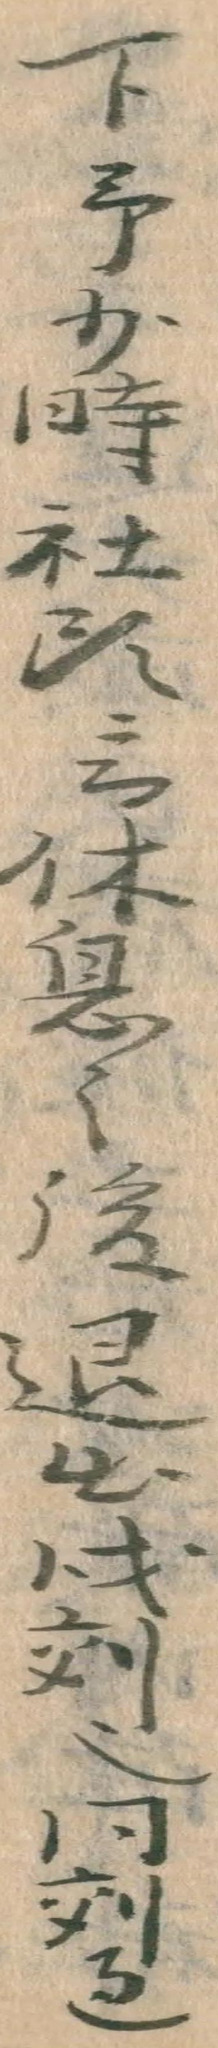下、予少時社頭ニ而休息之後退出、戌刻也、同刻過
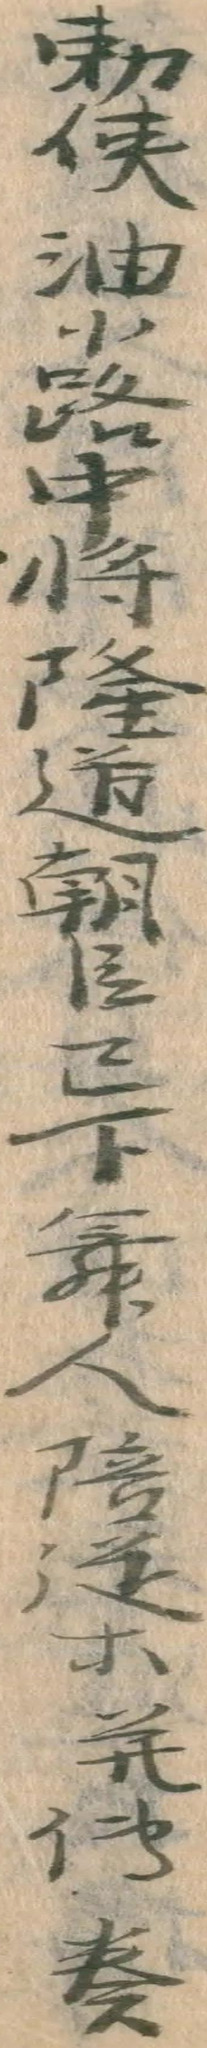勅使油小路中将隆道朝臣已下、舞人・陪従等并傳奏
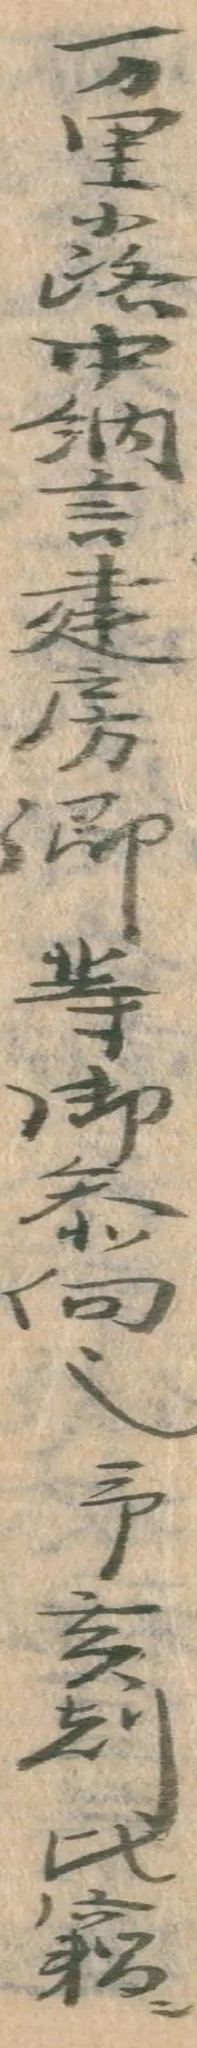万里小路中納言建房卿等御参向也、予亥刻比竊ニ
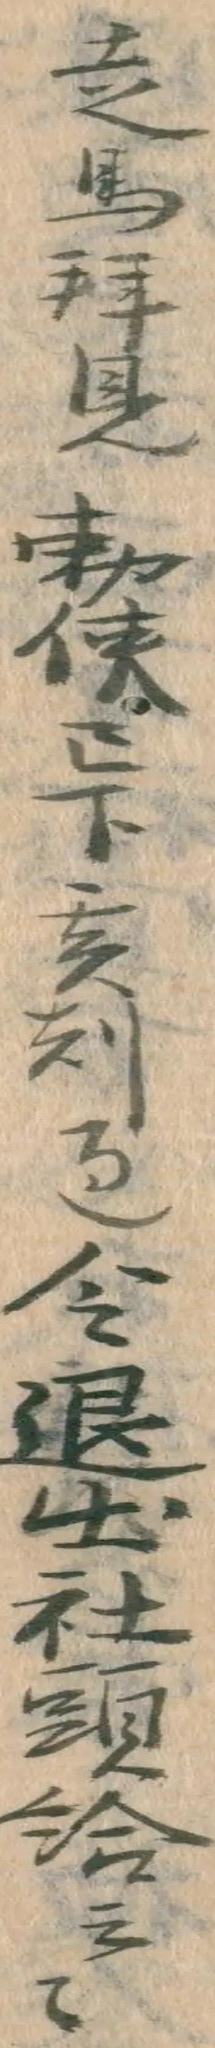走馬拝見、勅使已下亥刻過令退出、社頭給云々、
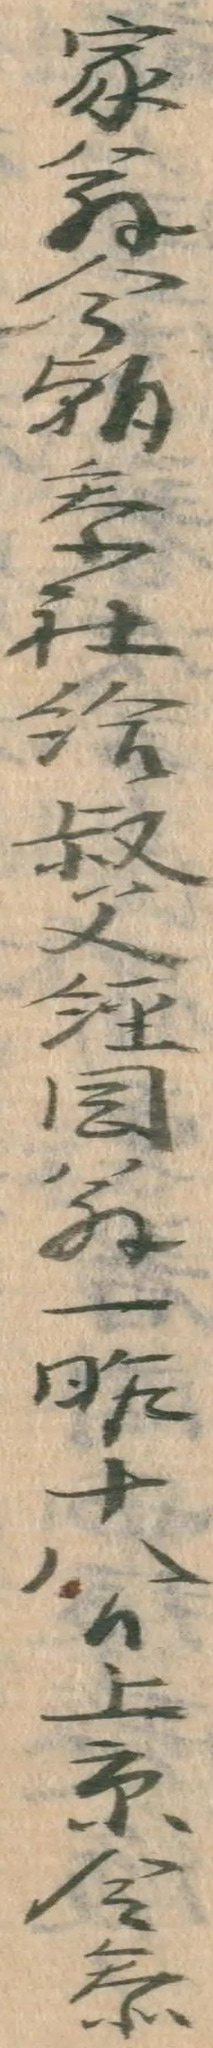家翁今朝参社給、叔父経岡翁、一昨十八日上京、令参
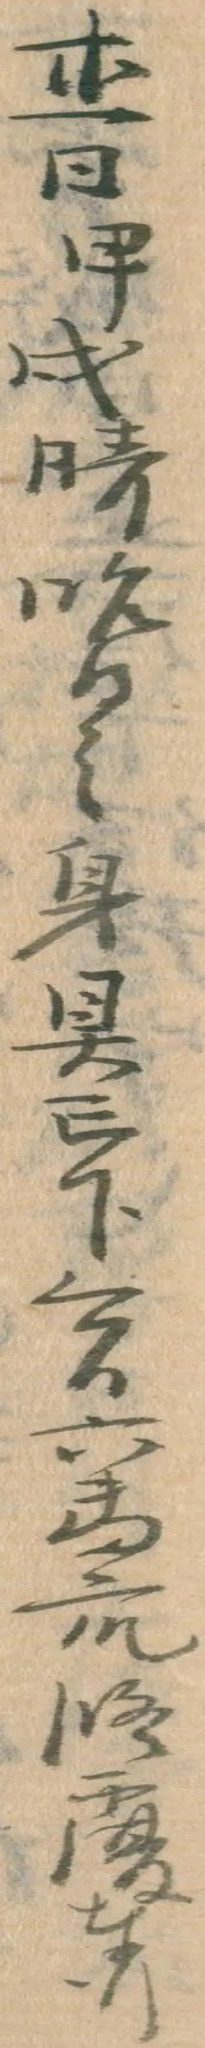廿一日甲戌晴、昨日之身具已下、今日六番衆修覆奉行
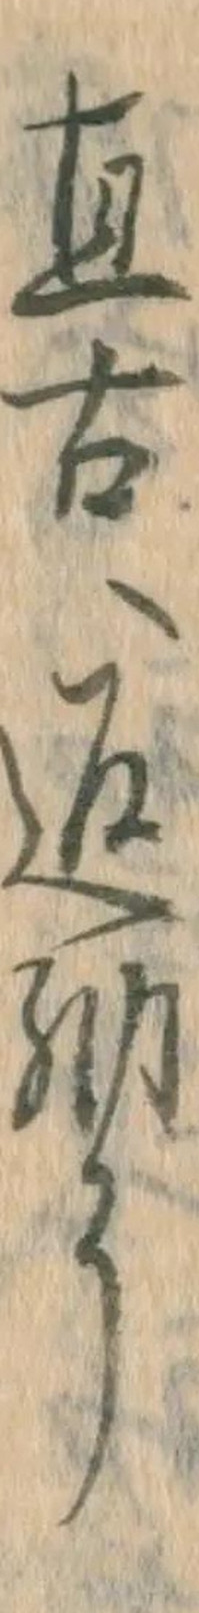直古へ返納了、
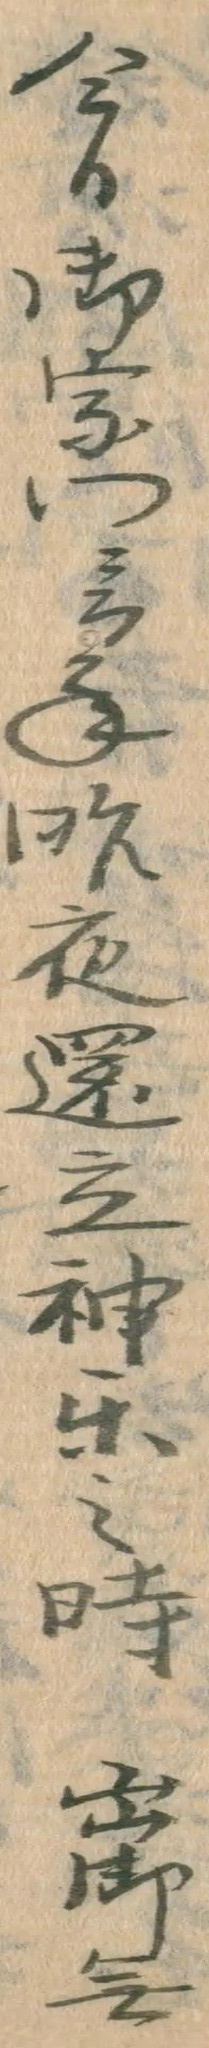今日御家門ニ而、年昨夜還立神楽之時、出御無
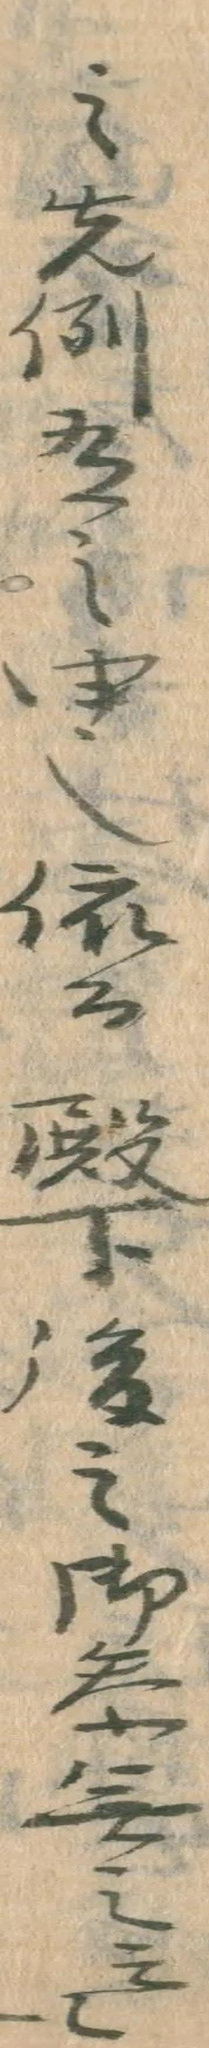之先例有之由也、依而殿下後之御参無之云々、
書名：賀茂社記録. 第63冊
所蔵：国立国会図書館 National Diet Library, JAPAN
